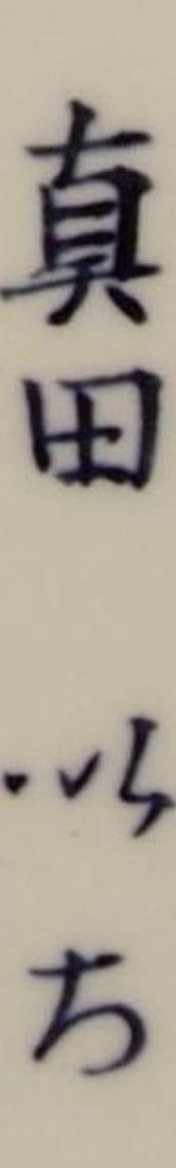真田いち
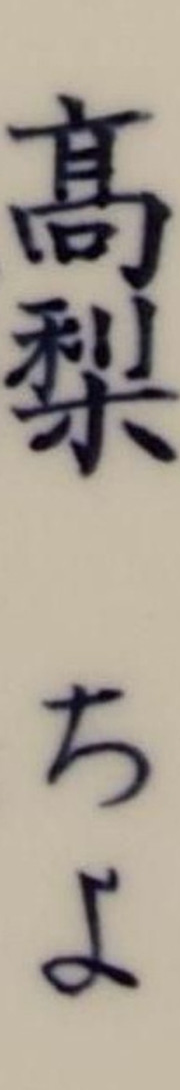高梨ちよ
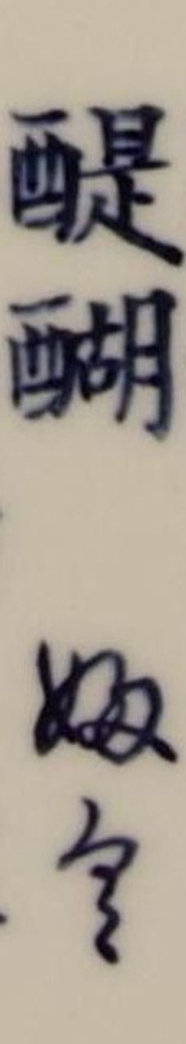醍醐ふく
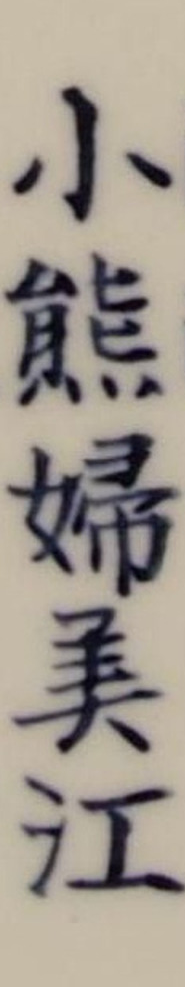小熊婦美江
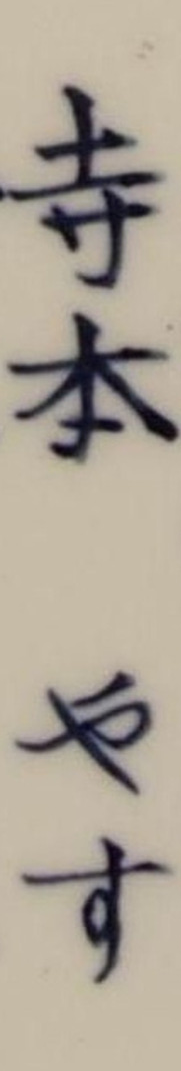寺本やす
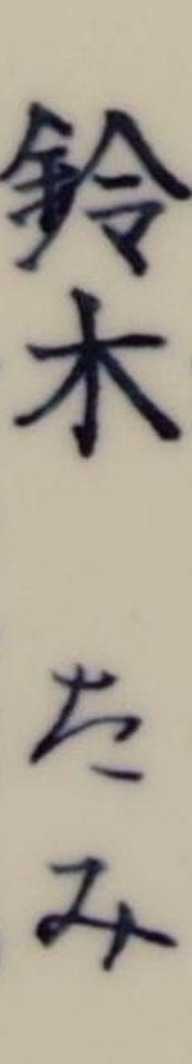鈴木たみ
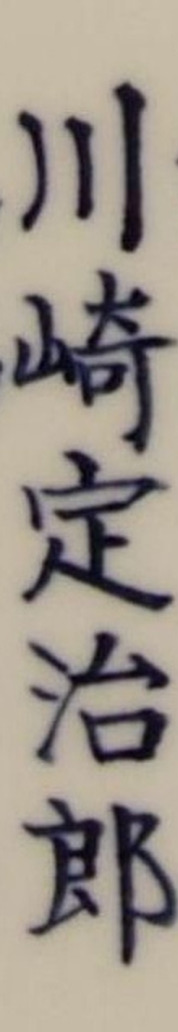川崎定治郎
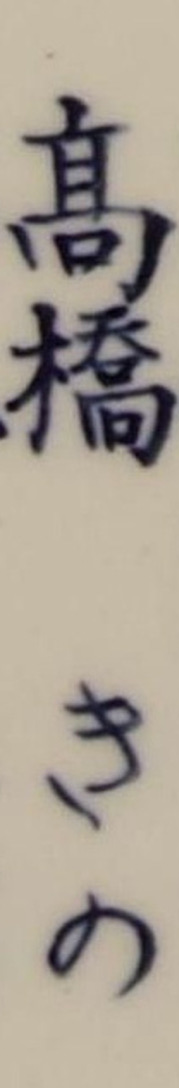高橋きの
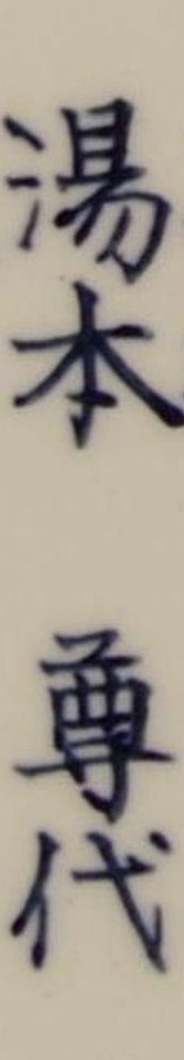湯本尊代
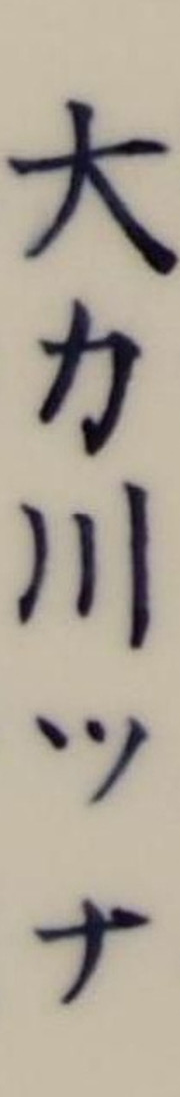大力川つな
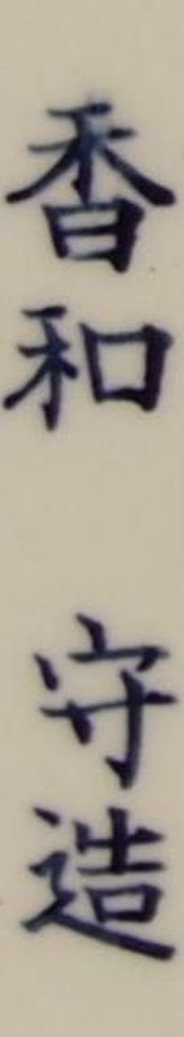香和守造
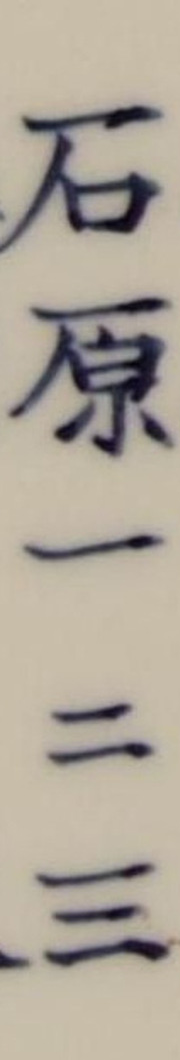石原一二三
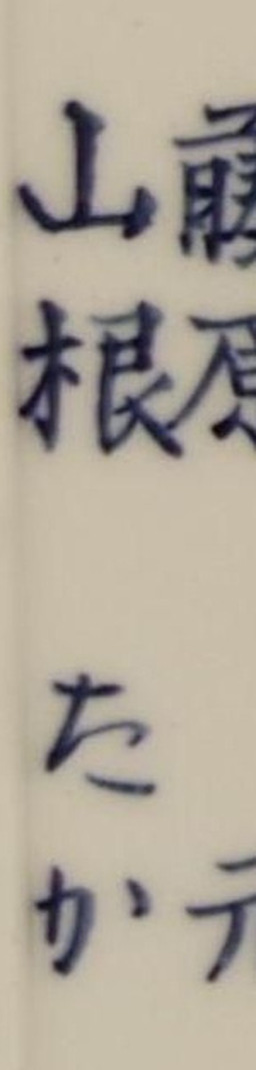山根たか

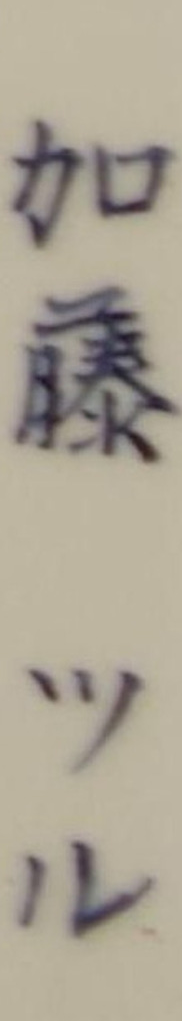加藤ツル
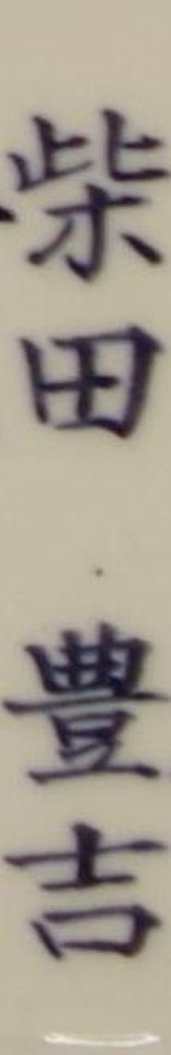柴田豊吉
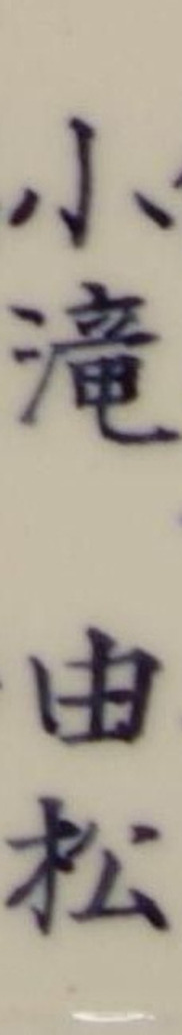小滝由松
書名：E~L
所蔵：高野山金剛峯寺
